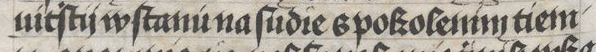uitẛtij wſtanú na ſudie s pokolením tiem¬
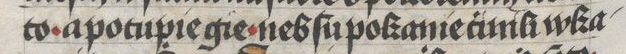to.a potupie gie.neb ſu pokaníe ċinili wka¬
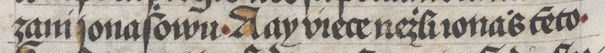zam Ionaẛowu.A ay viece neżli ionaṡ tēto.
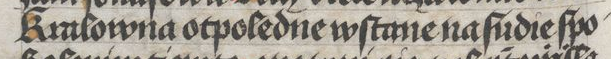Kralowna otpoledne wſtane na ſudie ſpo¬
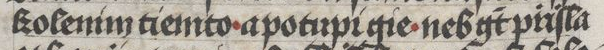kolením tiemto.a potupí gie.neb ḡt pṙiſla
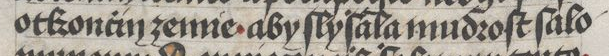otkonċin zemie.aby ſlyẛala mudroſt ſalo¬
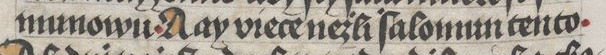munowu.A ay viece nezli ẛalomun tento.
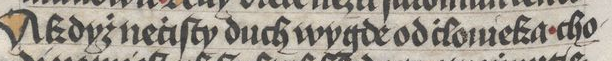A kdyż neċiſty duch wygde od ċlouieka.cho¬
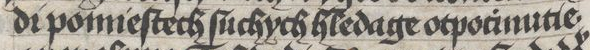dí pomíeſtech ſuchych hledage otpoċinutie.
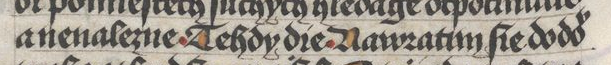a nenalezne.Tehdy díe.Nawratim ſie dodov
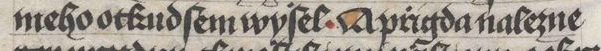meho otkudſem wyẛel.A pṙigda nalezne
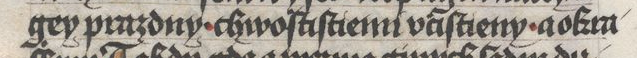gey prazdny.chwoẛti ſtiemi vċiſtieny.a okra¬
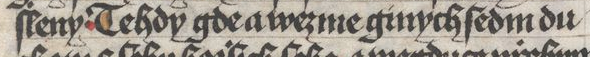ẛleny.Tehdy gde a wezme ginych ſedm du¬
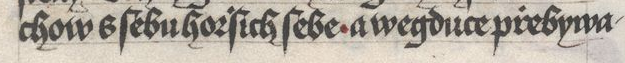chow sſebu horẛich ſebe.a wegduce pṙebywa¬
